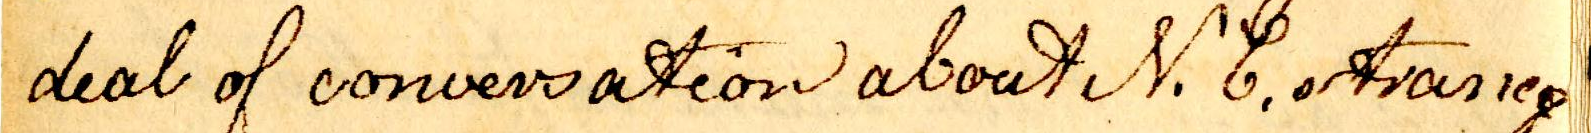deal of conversation about N. E. straneg
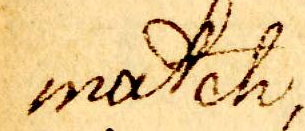match
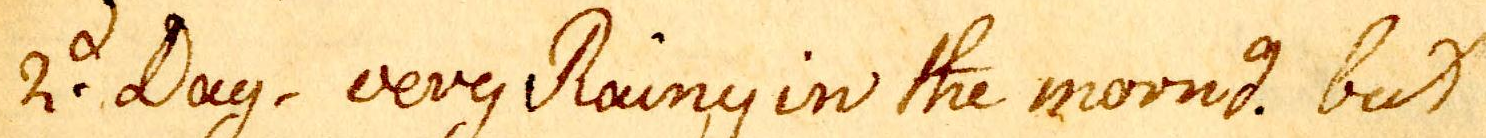2^d. Day- very Rainy in the morn^g. but
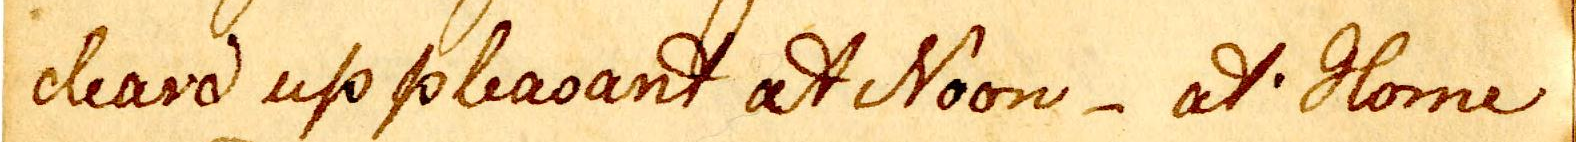cleard up pleasant at Noon- at Home
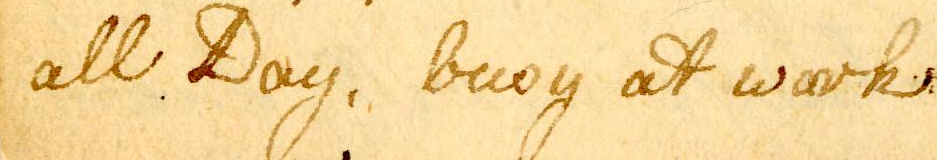all Day, busy at work
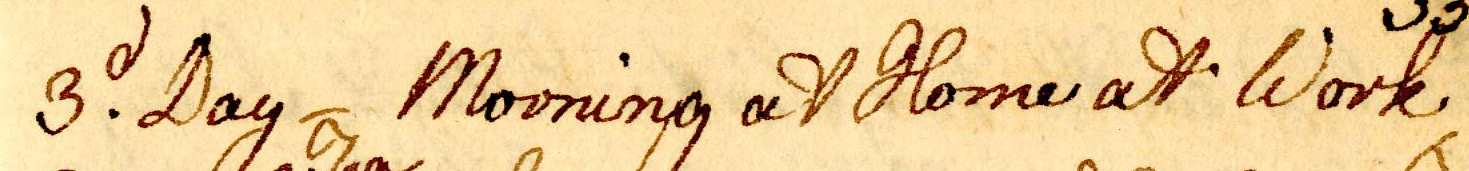3^d. Day- Morning at Home at Work
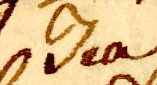Tea
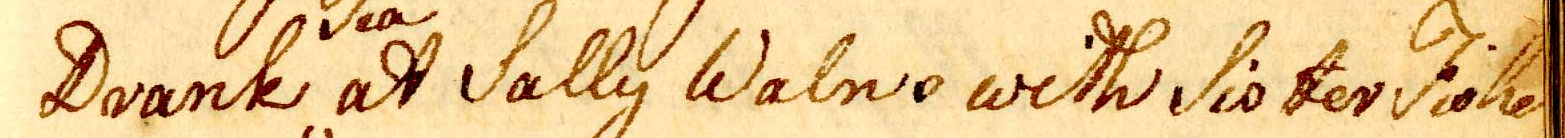Drank ^ at Sally Walns with Sister Fishe
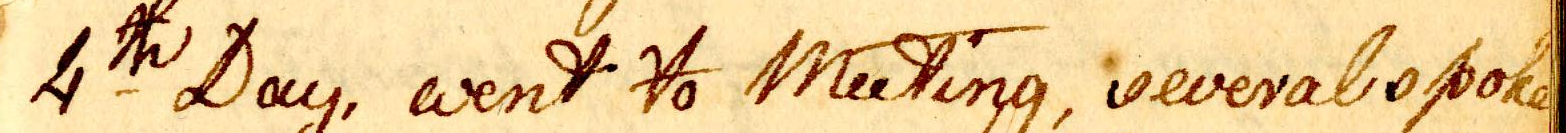4^th Day, went to Meeting, several spoke
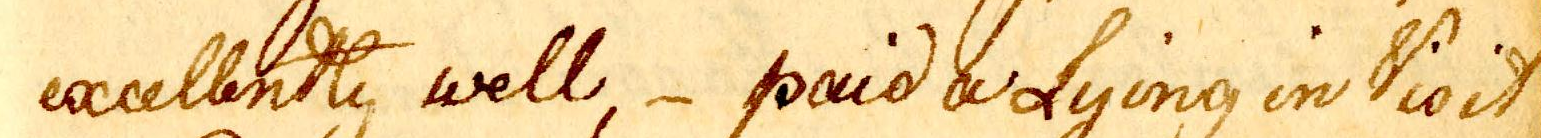excellently well,- paid a Lying in Visit
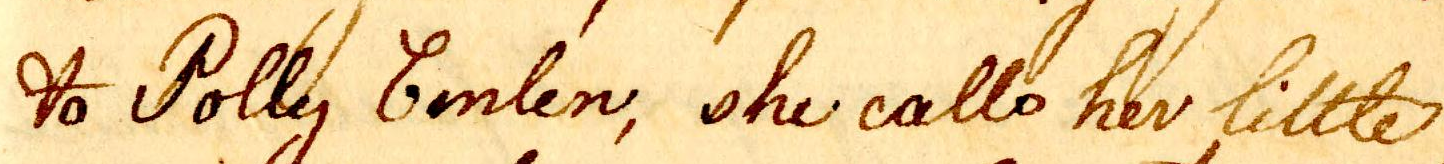to Polly Emlen, she calls her little
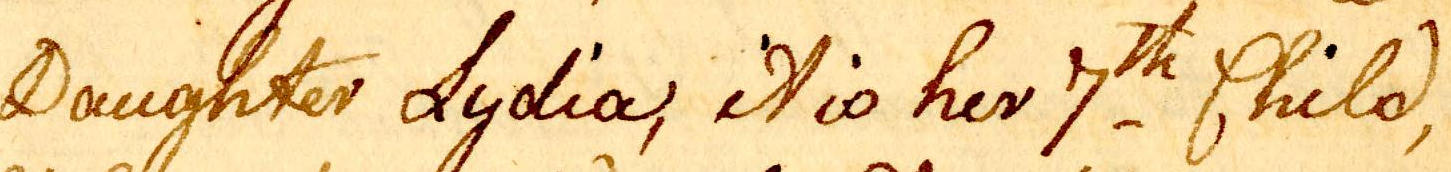Daughter Lydia, it is her 7^th Child,
